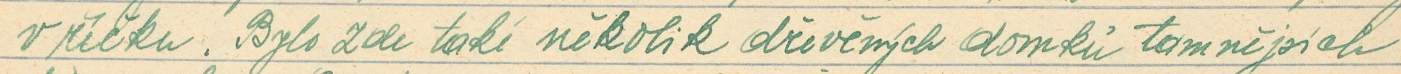v říčku. Bylo zde také několik dřevěných domků tamnějších
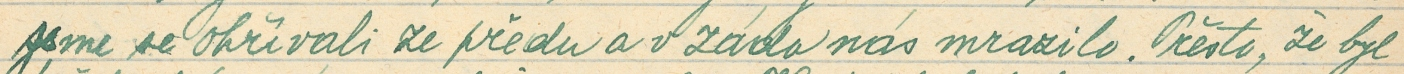jsme se ohřívali ze předu a v záda nás mrazilo. Přesto, že byl
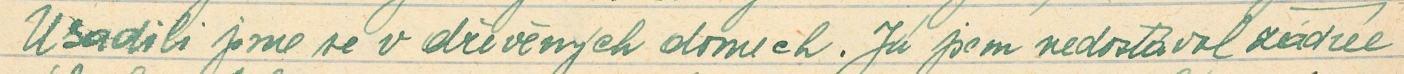Usadili jsme se v dřevěných domech. Já jsem nedostával žádné
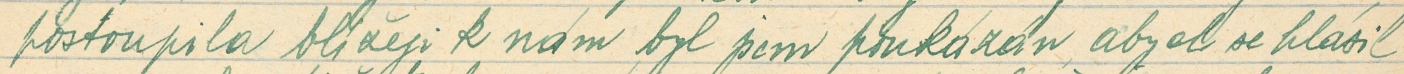postoupila blížeji k nám byl jsem poukázán, abych se hlásil
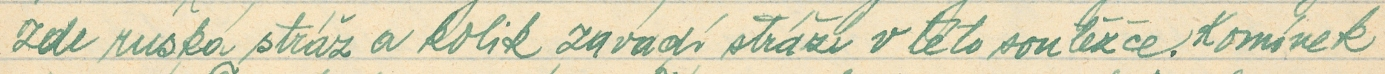zde ruská stráž a kolik zavádí stráží v této soutěžce. Komínek
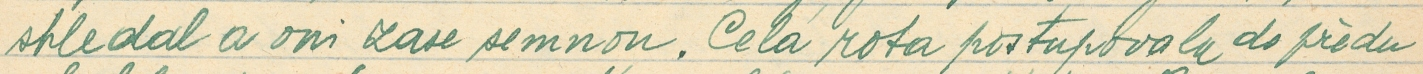shledal a oni zase se mnou. Celá rota postupovala do předu
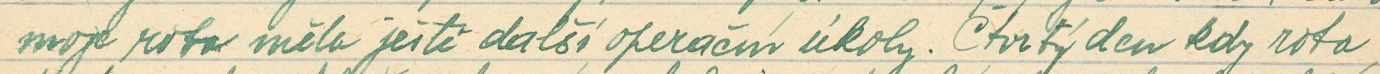moje rota měla ještě další operační úkoly. Čtvrtý den kdy rota
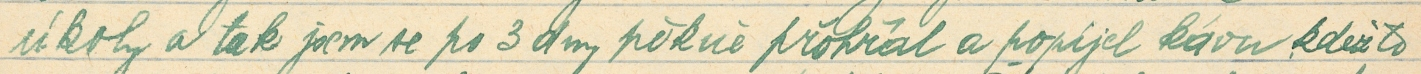úkoly a tak jsem se po 3 dny pěkně přohřál a popíjel kávu kdežto
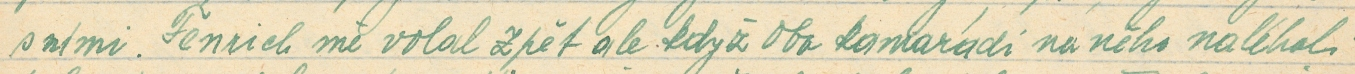s ními. Fenrich mě volal zpět ale když oba kamarádi na něho naléhali
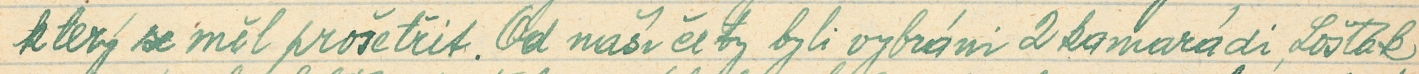který se měl prošetřit. Od naší čety byli vybráni 2 kamarádi, Lošták
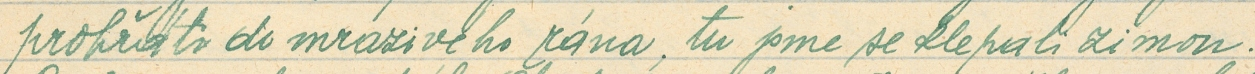prohřáti do mraziveho rána, tu jsme se klepali zimou.
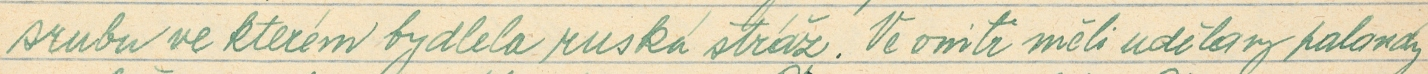srubu ve kterém bydlela ruská stráž. Ve vnitř měli udělany palandy
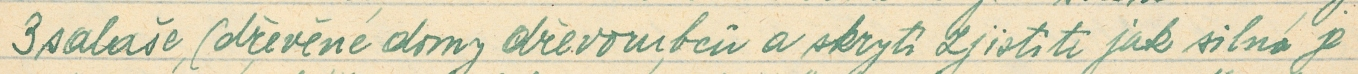3 salaše (dřevěné domy dřevorubců a skrytí zjistiti jak silná je
